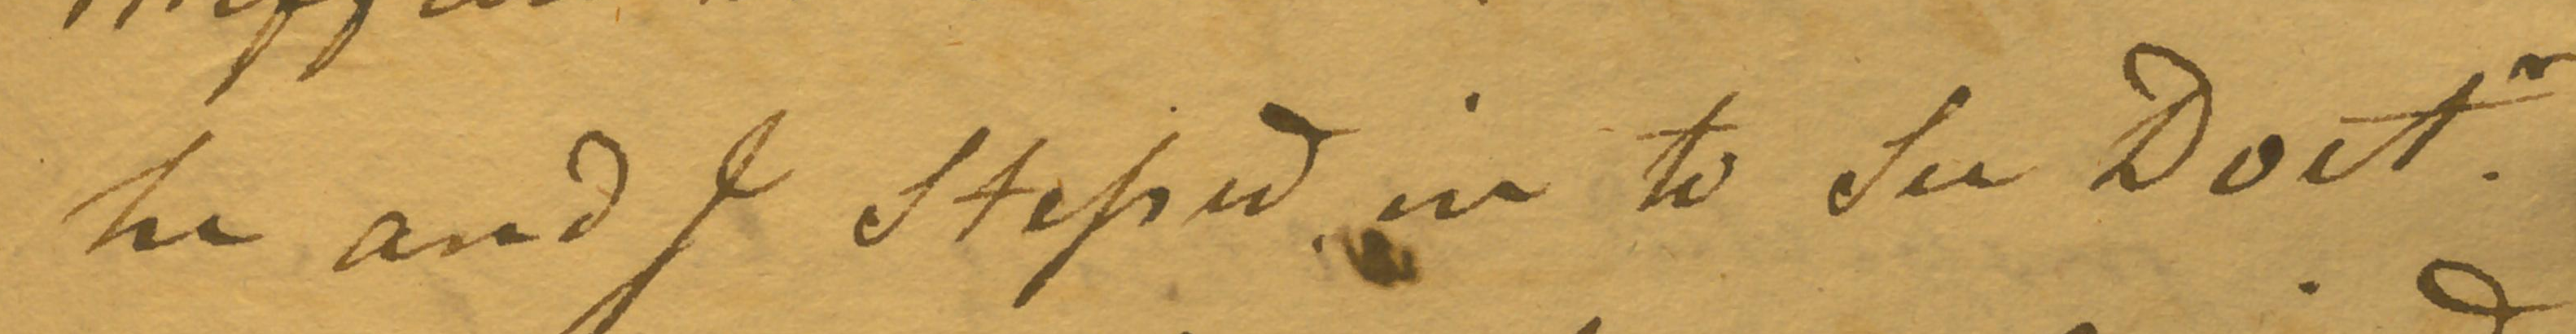he and I steped in to see Doct^r.
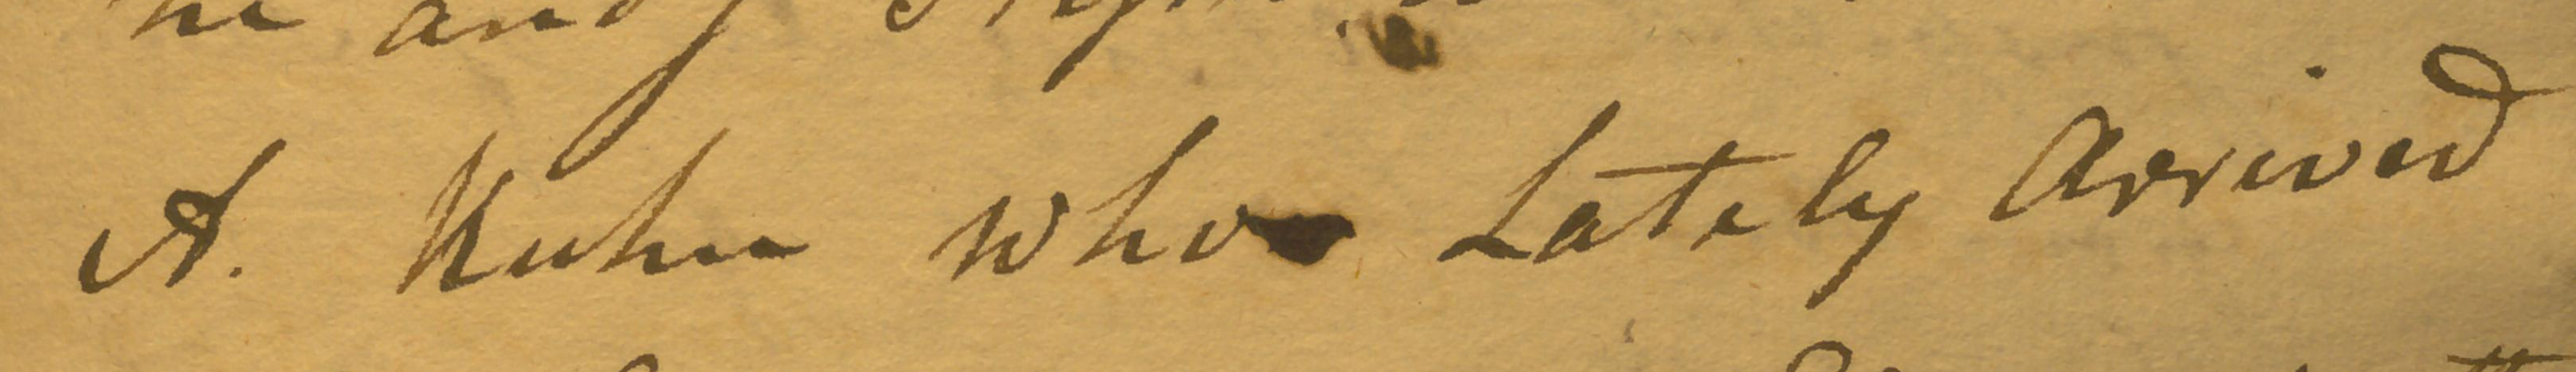A. Kuhn who Lately Arrived
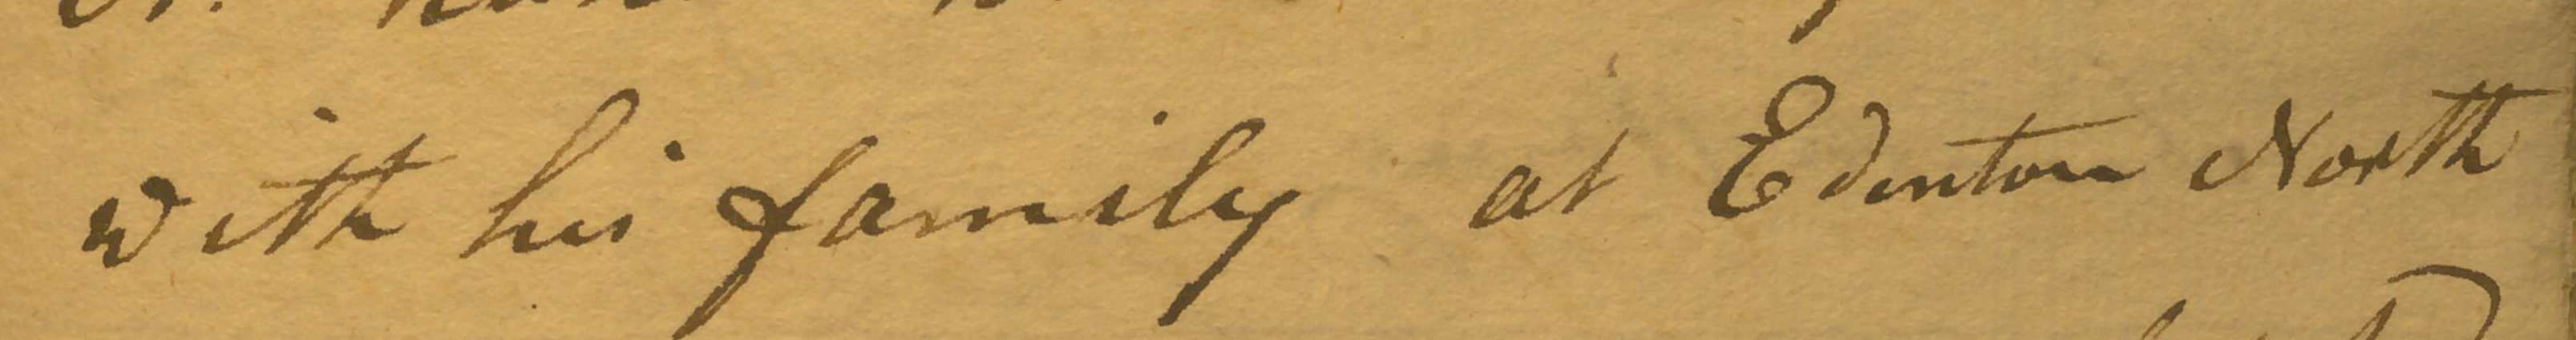with his family at Edenton North
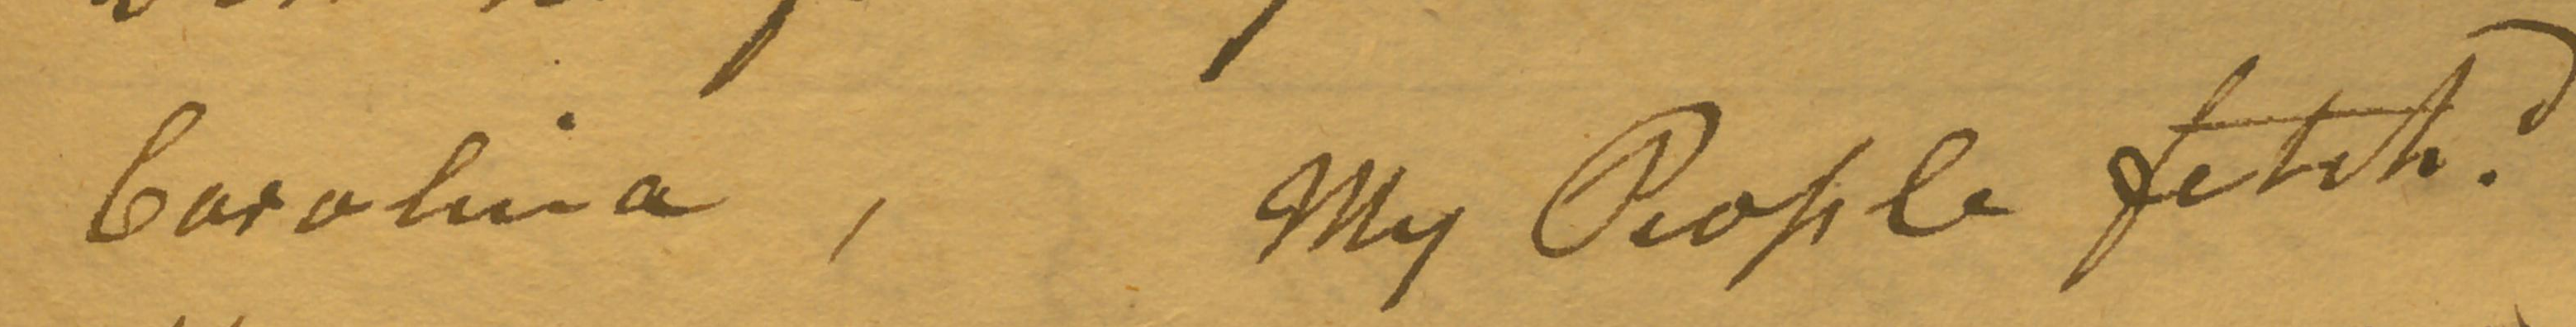Carolina, My People fetch^d.
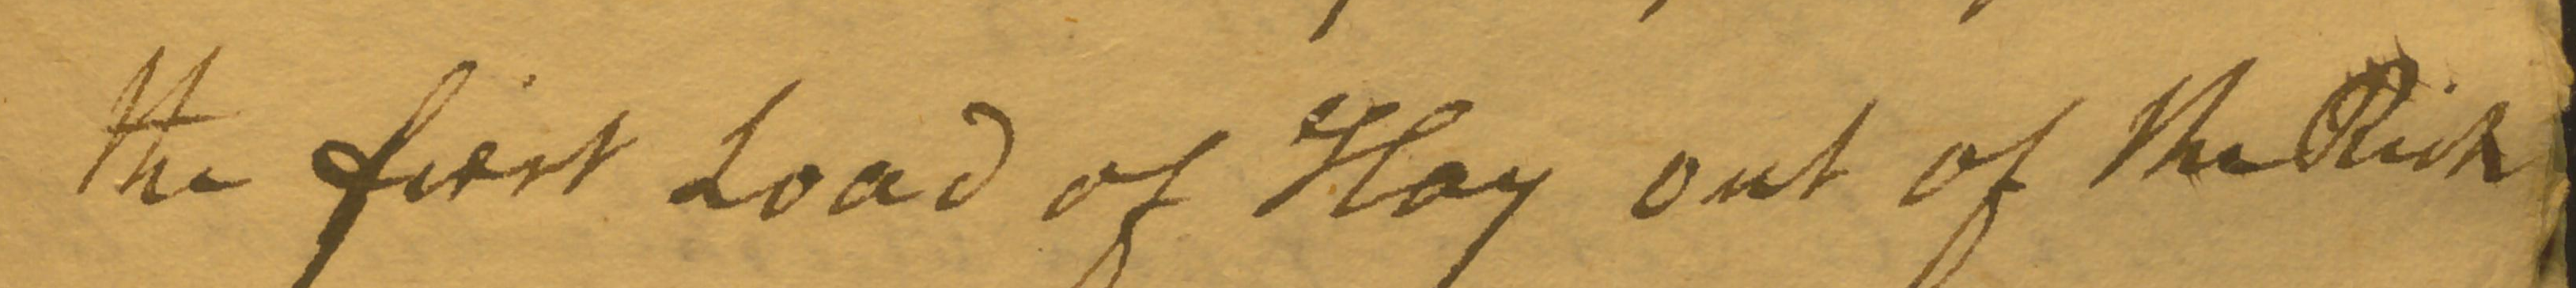the first Load of Hay out of the Rush
